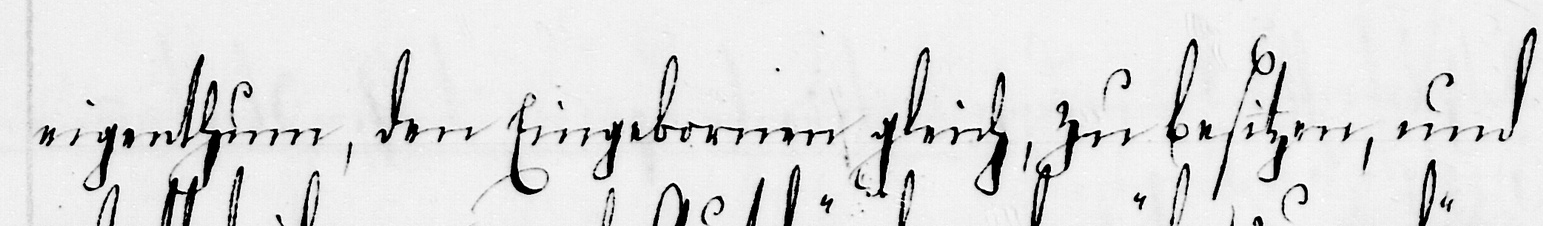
eigenthum, den Eingebornen gleich, zu besitzen, und
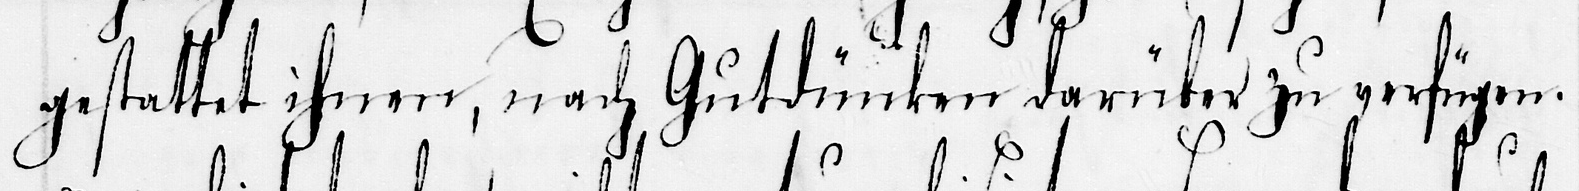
gestattet ihnen, nach Gutdünken darüber zu verfügen.
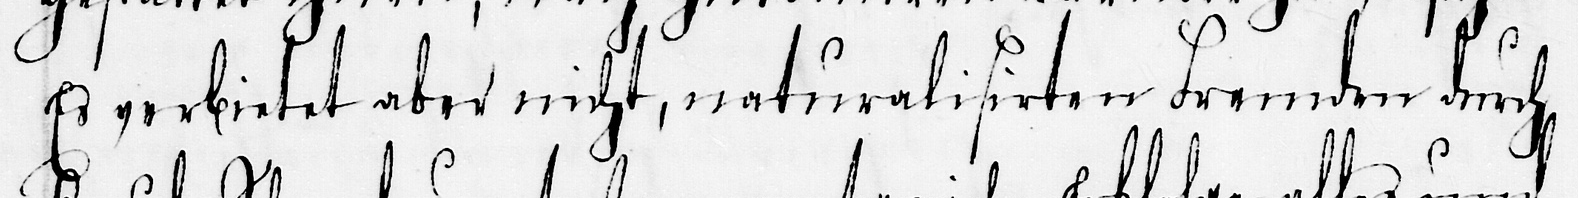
Es verbietet aber nicht, naturalisirten Fremden durch
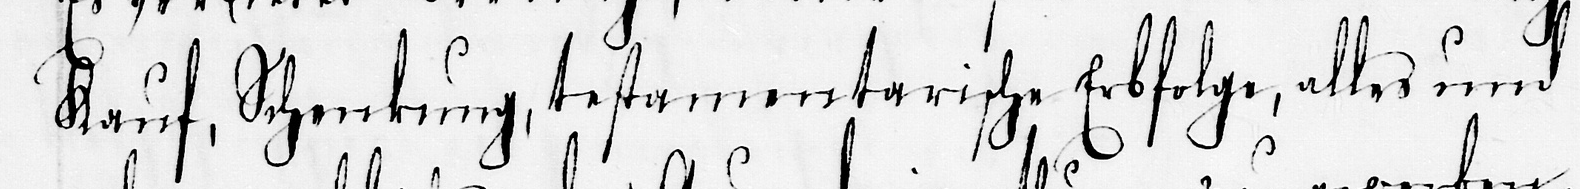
Kauf, Schenkung, testamentarische Erbfolge, alles und
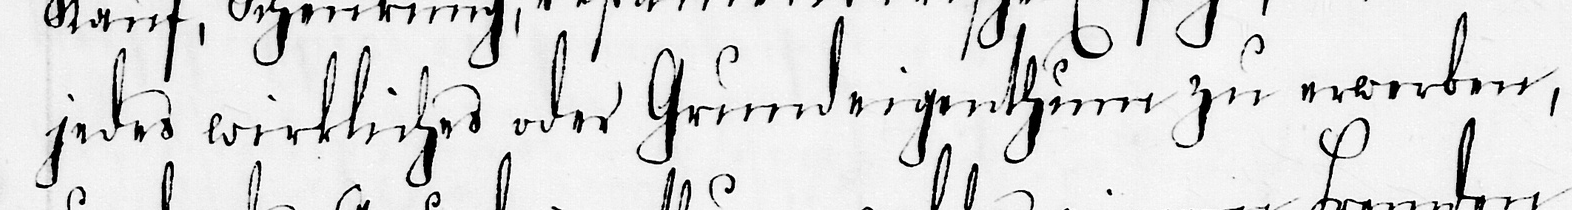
jedes wirkliches oder Grundeigenthum zu erwerben,
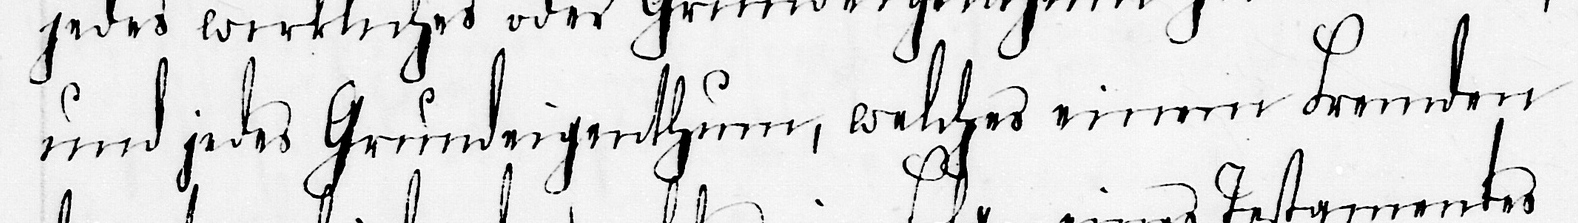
und jedes Grundeigenthum, welches einem Fremden
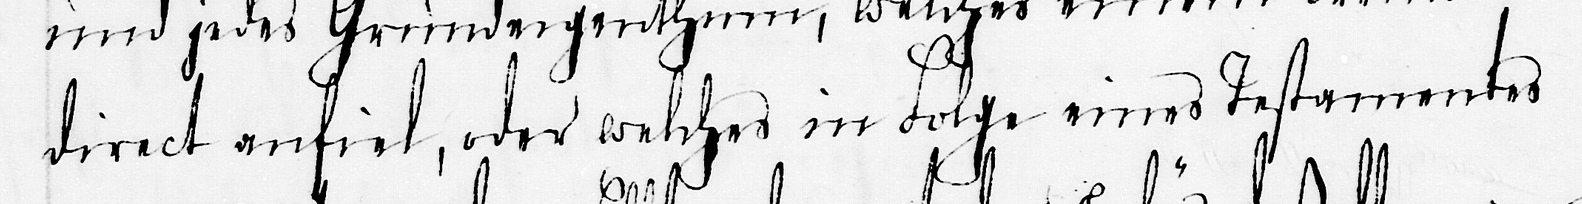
direct anfiel, oder welches in Folge eines Testamentes
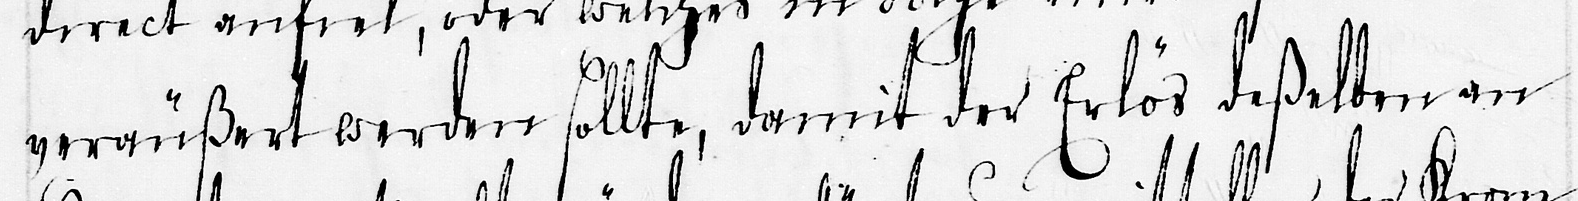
veräußert werden sollte, damit der Erlös deßelben an
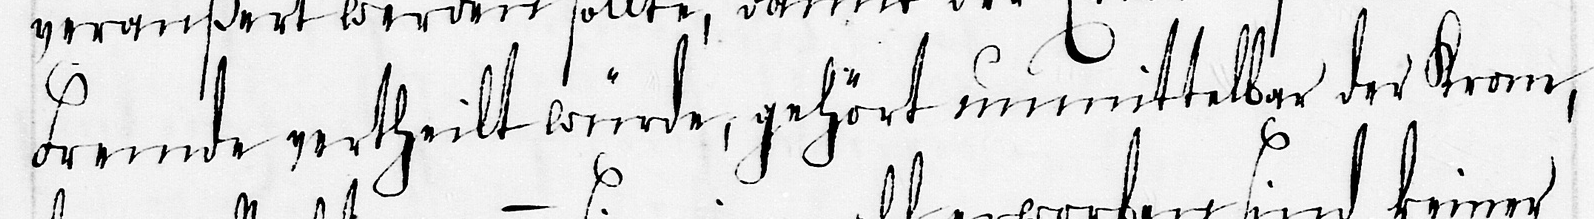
Fremde vertheilt würde, gehört unmittelbar der Krone,
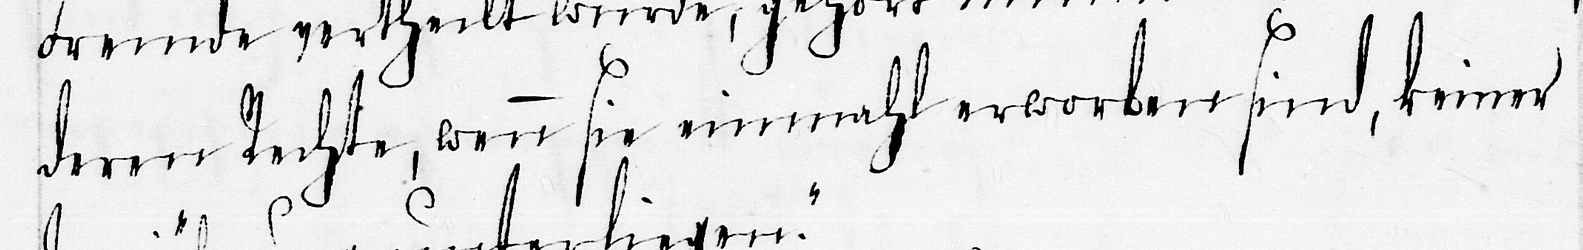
deren Rechte, wenn sie einmahl erworben sind, keiner
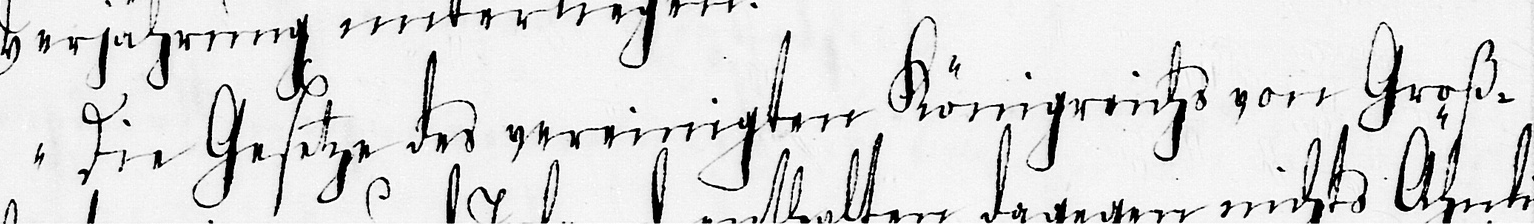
„Die Gesetze des vereinigten Königreichs von Groß¬
